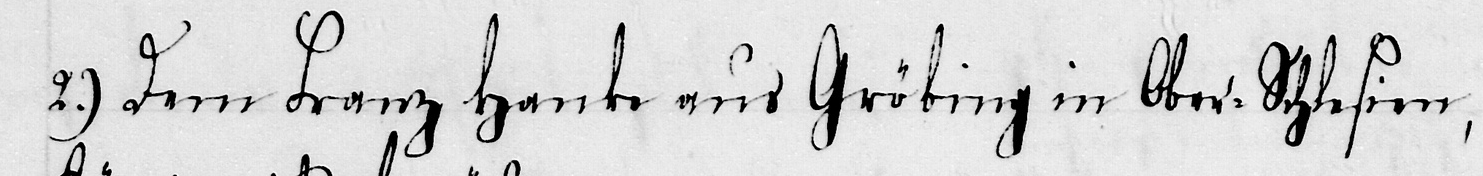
2.) Dem Franz Hanke aus Gröbing in Ober-Schlesien,
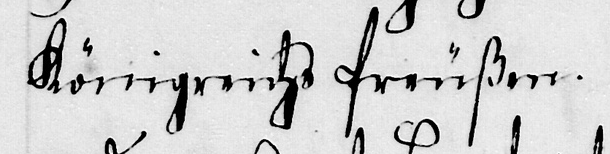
Königreichs Preußen.
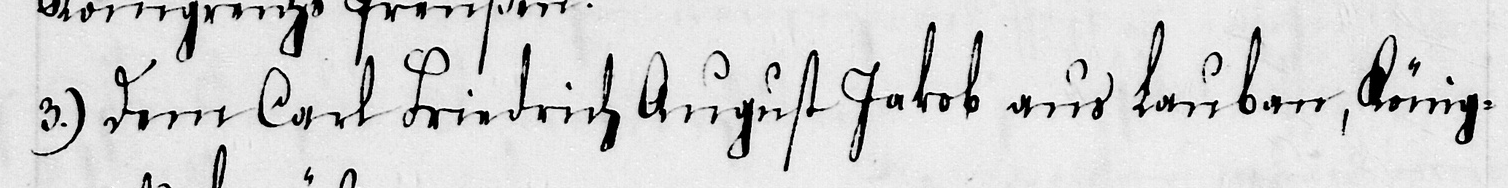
3.) Dem Carl Friedrich August Jakob aus Lauban, König¬
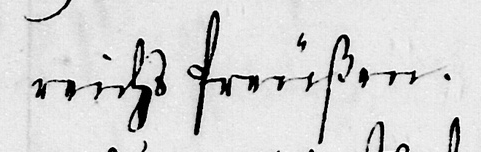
reichs Preußen.
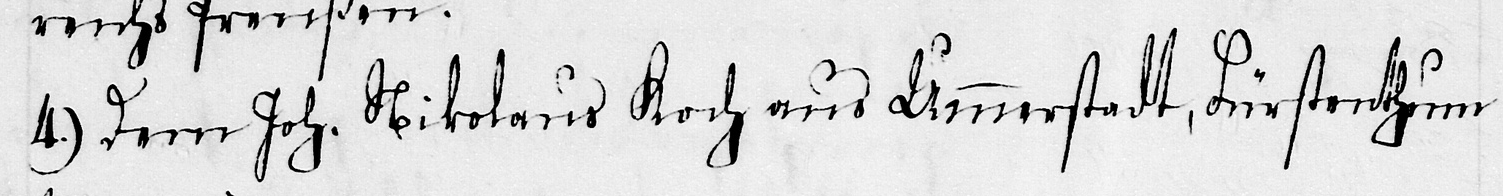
4.) Dem Joh. Nikolaus Koch aus Ummerstadt, Fürstenthum
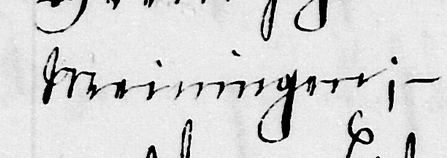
Meiningen; –
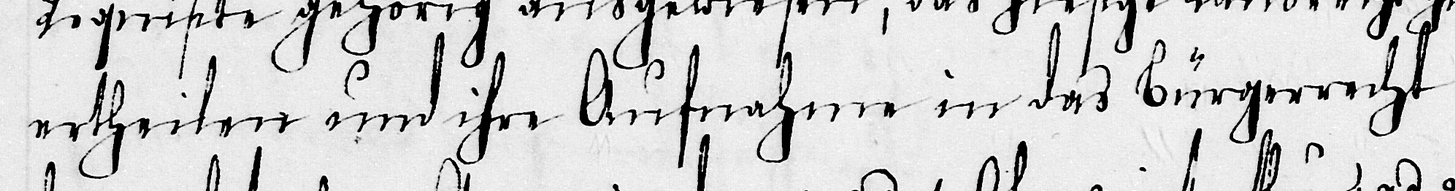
ertheilen und ihre Aufnahme in das Bürgerrecht
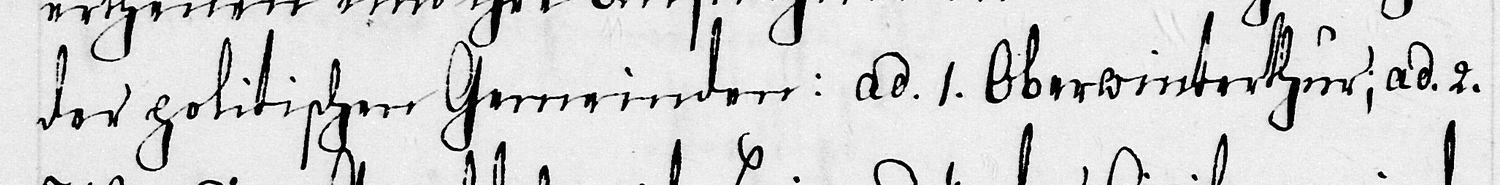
der politischen Gemeinden: ad. 1. Oberwinterthur; ad. 2.
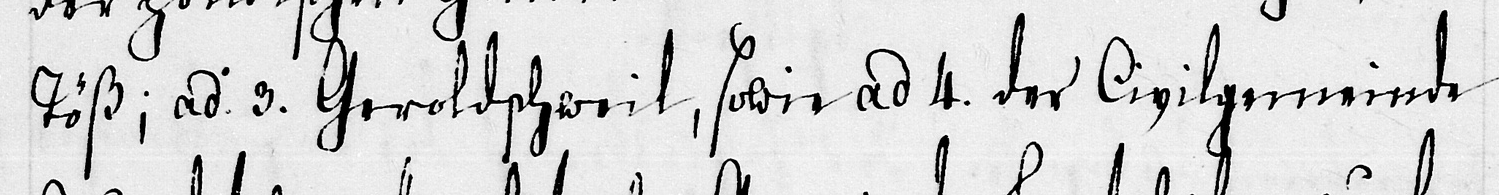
Töß; ad. 3. Geroldschweil, sowie ad 4. der Civilgemeinde
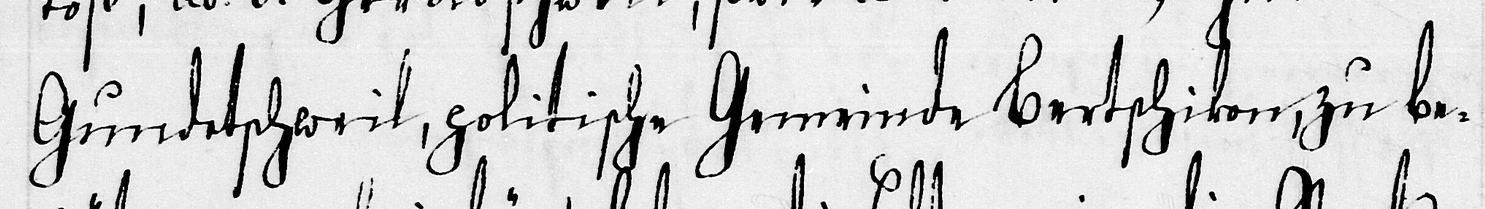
Gundetschweil, politische Gemeinde Bertschikon, zu be¬
